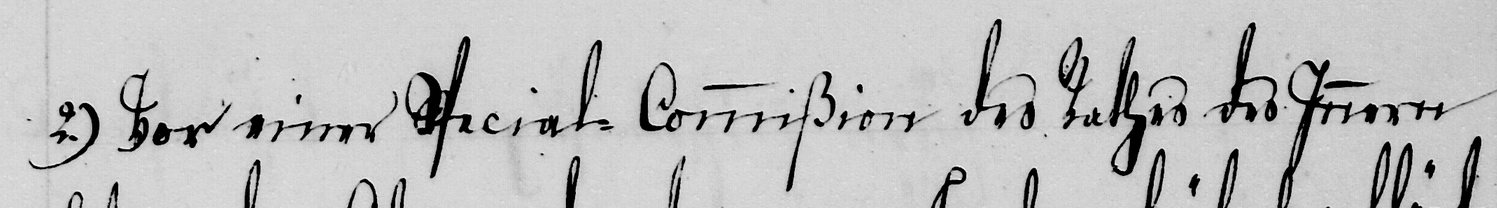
2.) Vor einer Special-Commißion des Rathes des Innern
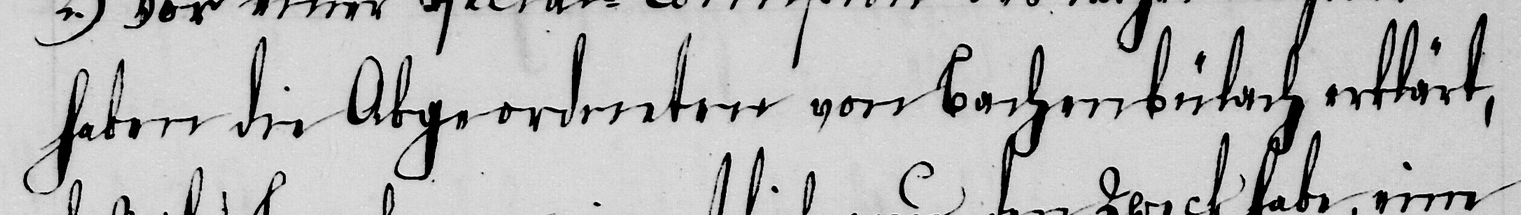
haben die Abgeordneten von Bachenbülach erklärt,
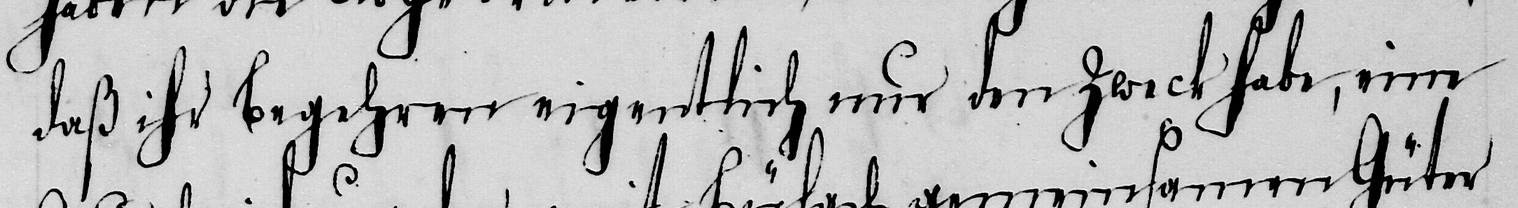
daß ihr Begehren eigentlich nur den Zweck habe, eine
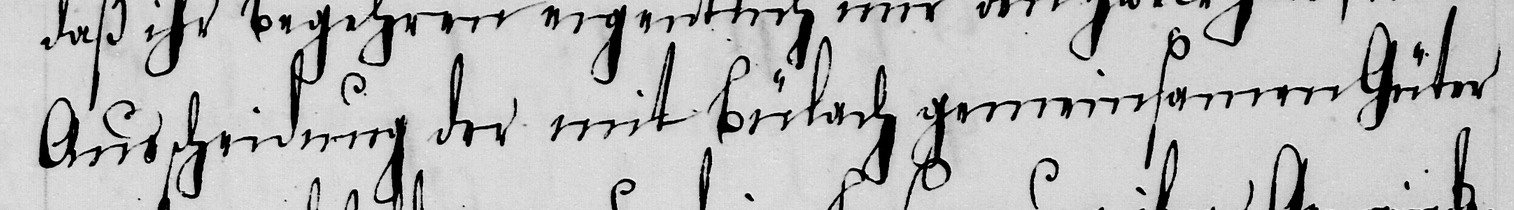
Ausscheidung der mit Bülach gemeinsamen Güter
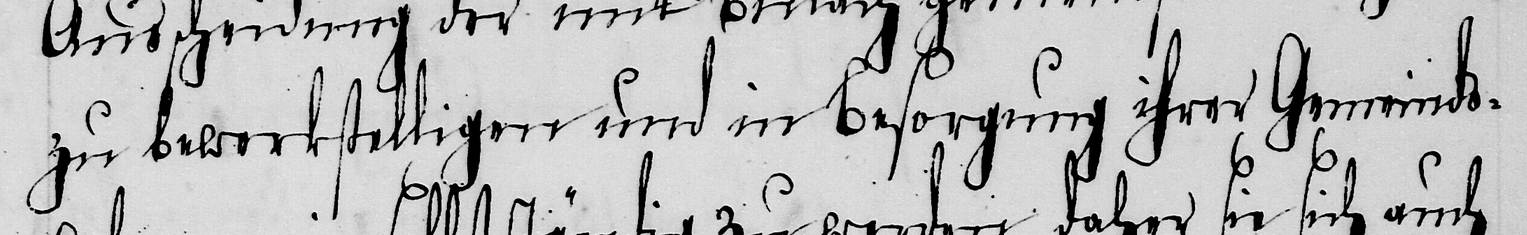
zu bewerkstelligen und in Besorgung ihrer Gemeind¬
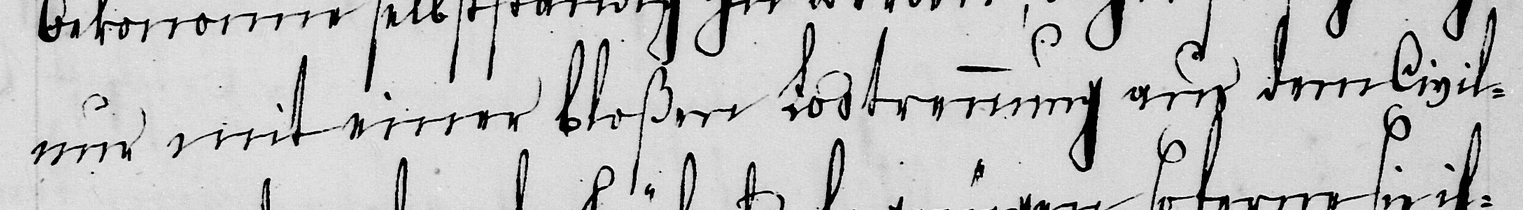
nur mit einer bloßen Lostrennung aus dem Civil¬
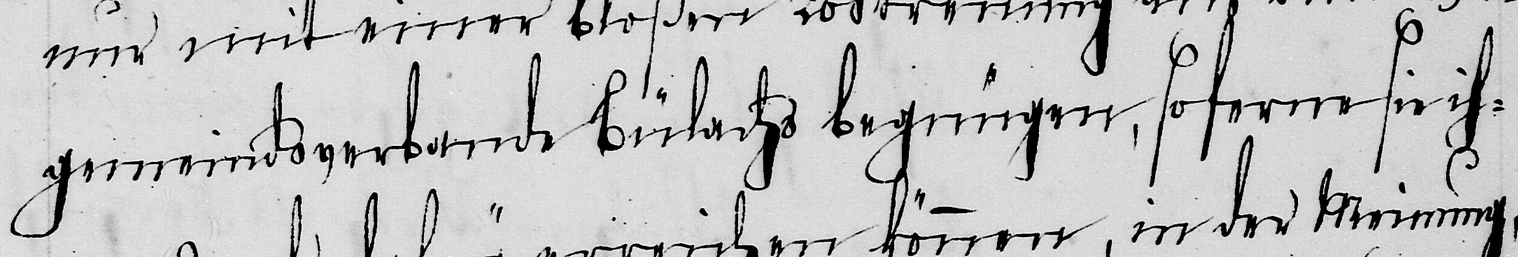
gemeindsverbande Bülachs begnügen, so ferne sie ih¬
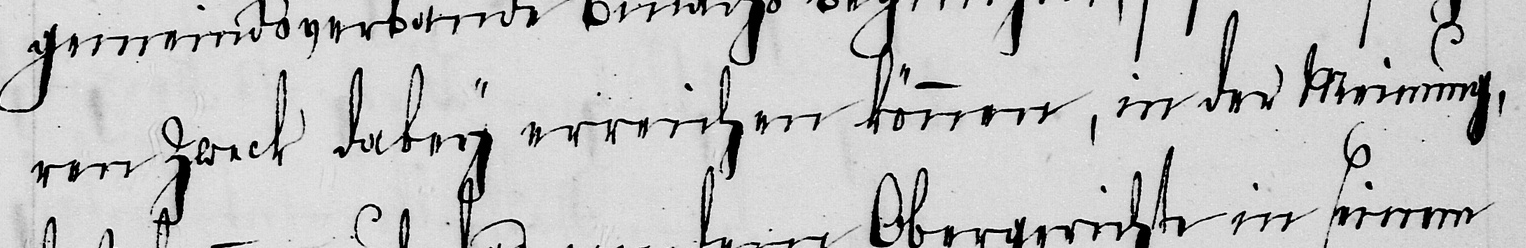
ren Zweck dabey erreichen können, in der Meinung,
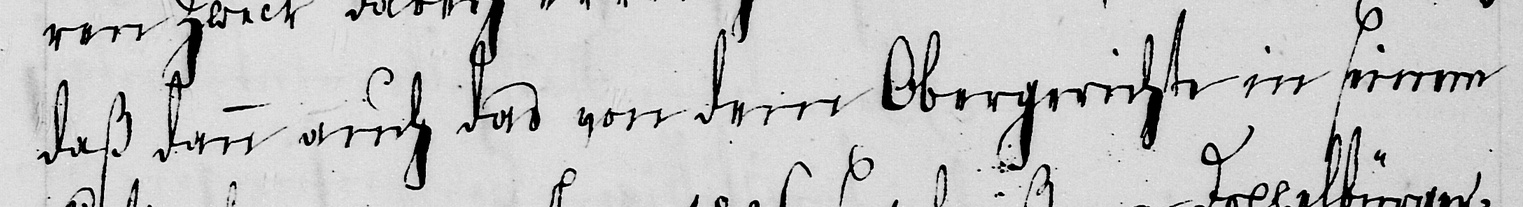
daß dann auch das von dem Obergerichte in seinem
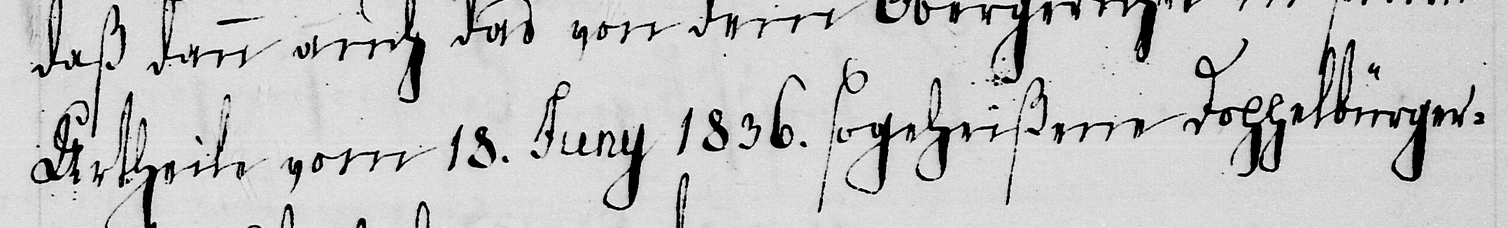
Urtheile vom 18. Juny 1836. sogeheißene Doppelbürger¬
